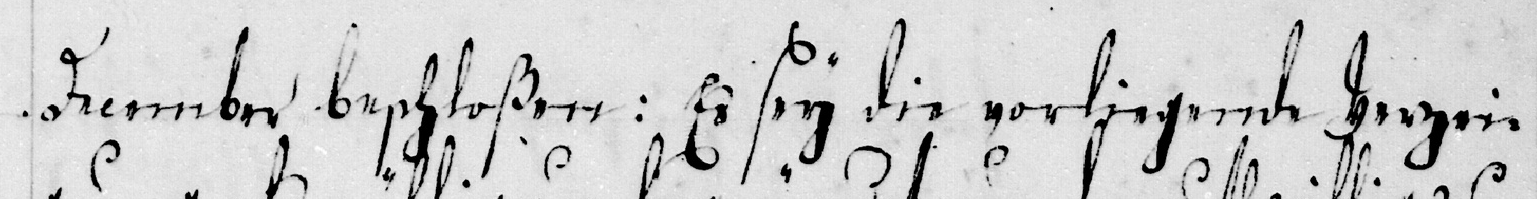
December beschloßen: Es sey die vorliegende Verzei¬
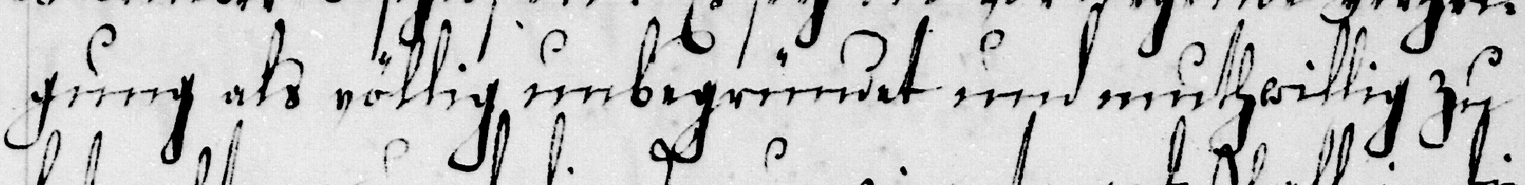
gung als völlig unbegründet und muthwillig zu
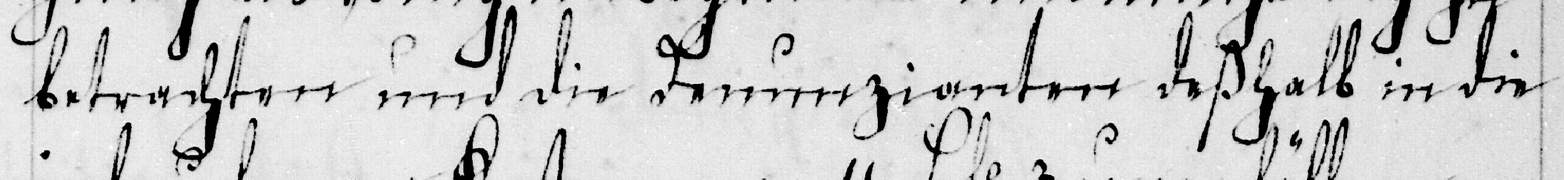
betrachten und die Denunzianten deßhalb in die
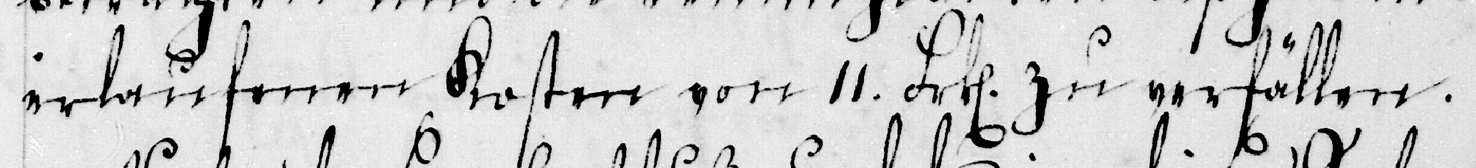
erlaufenen Kosten von 11. Frk[en]. zu verfällen.
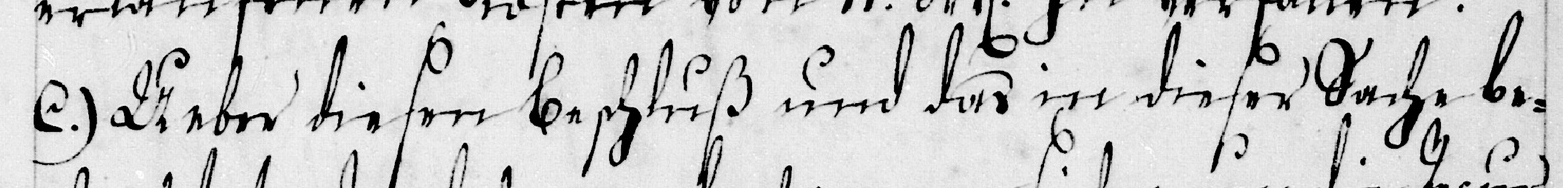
C.) Ueber diesen Beschluß und das in dieser Sache be¬
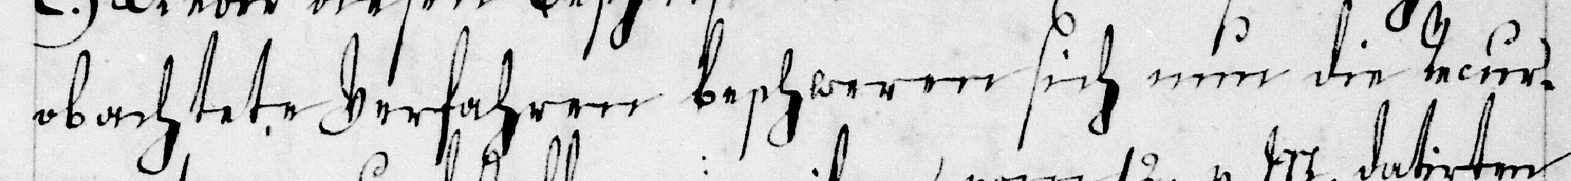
obachtete Verfahren beschweren sich nun die Recur¬
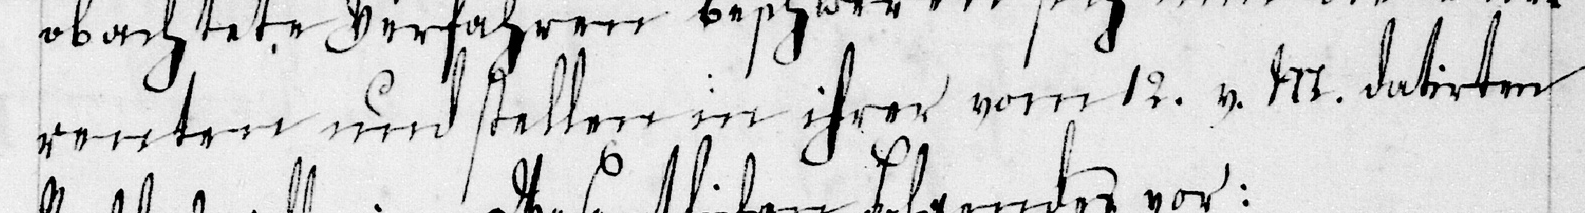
renten und stellen in ihrer vom 12. v. M. datirten
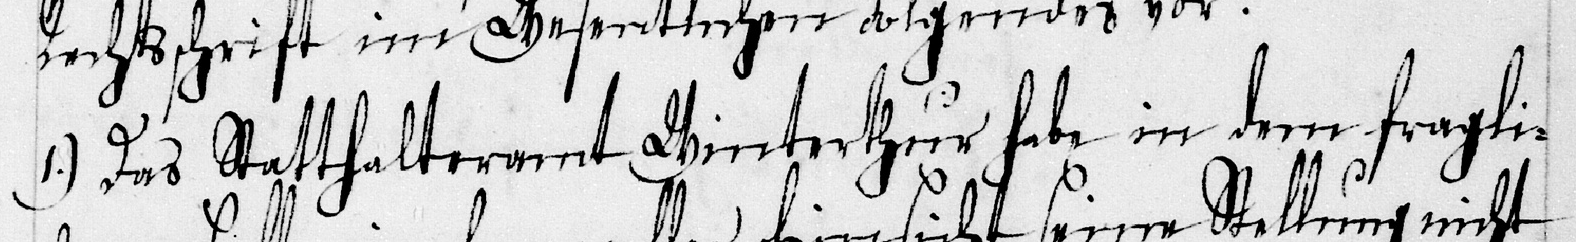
1.) Das Statthalteramt Winterthur habe in dem fragli¬
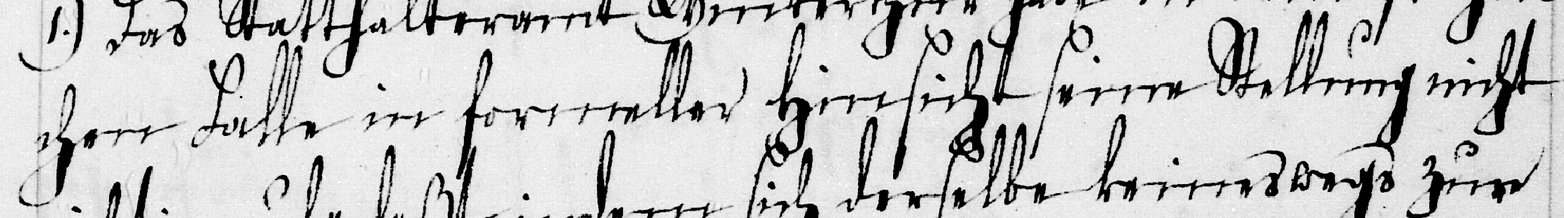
chen Falle in formeller Hinsicht seine Stellung nicht
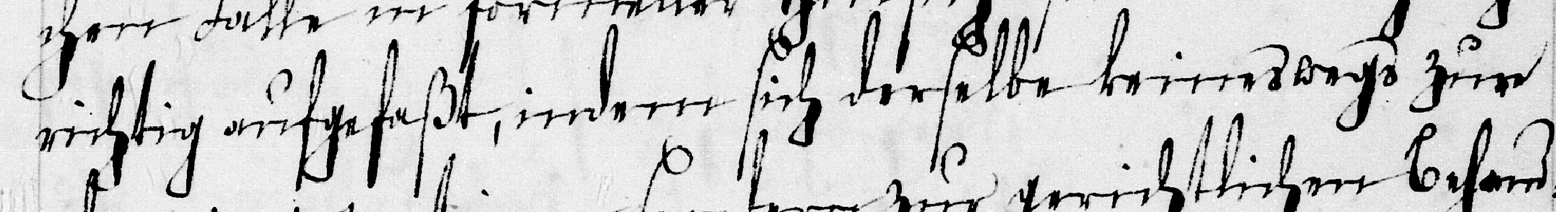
richtig aufgefaßt; indem sich derselbe keineswegs zur
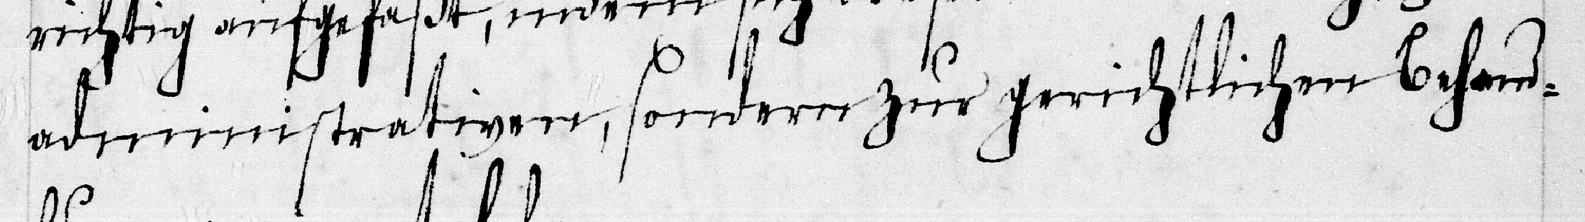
administrativen, sondern zur gerichtlichen Behand¬
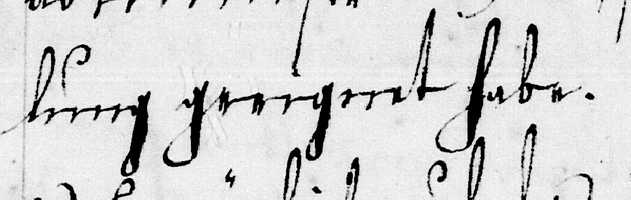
lung geeignet habe.
